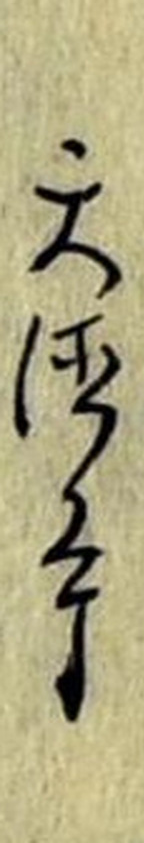天龍寺
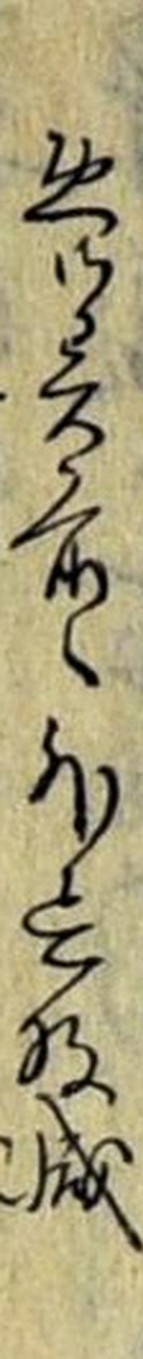惣御霊前へ外壱枚減

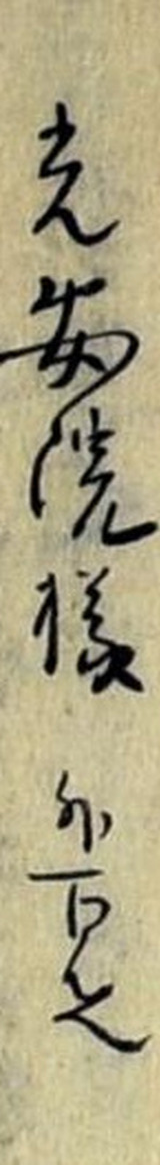光安院様外百疋
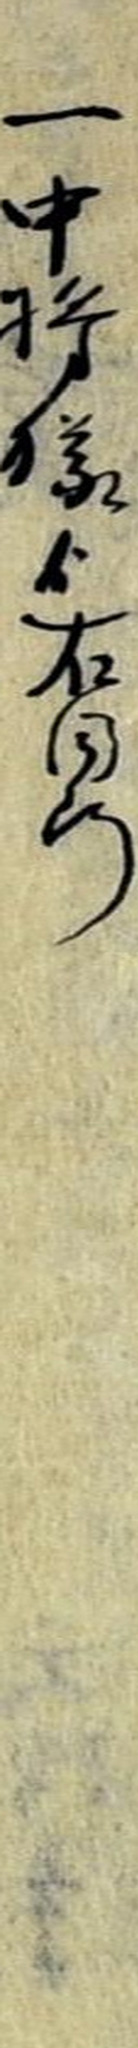一中将様ゟ右同断
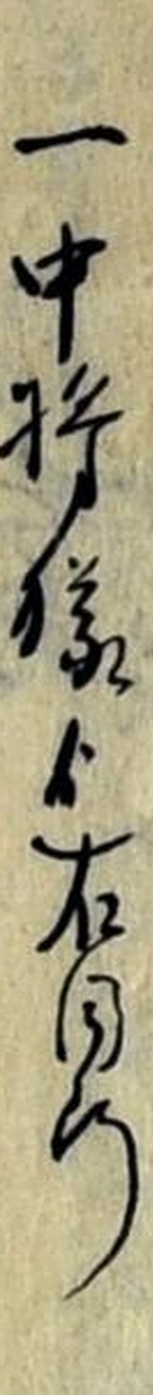一中将様ゟ右同断
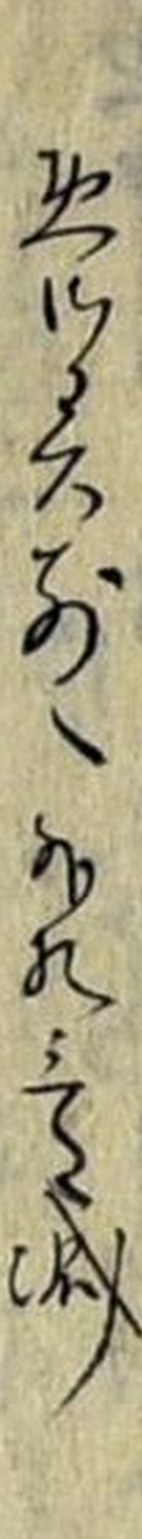惣御霊前へ外拾三匁減
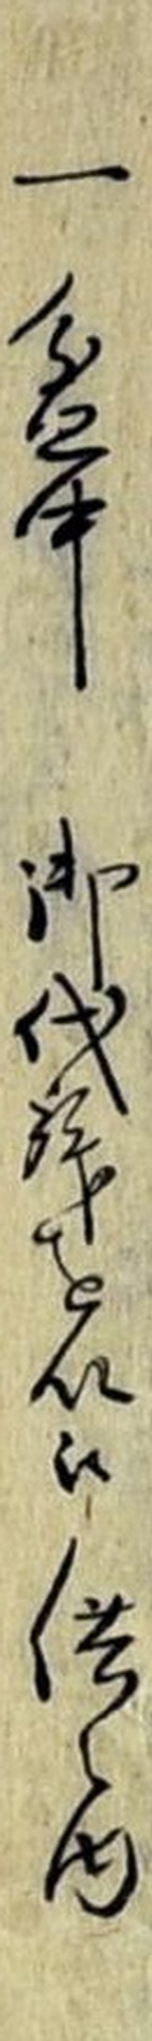一盆中御代拝を以被供候内
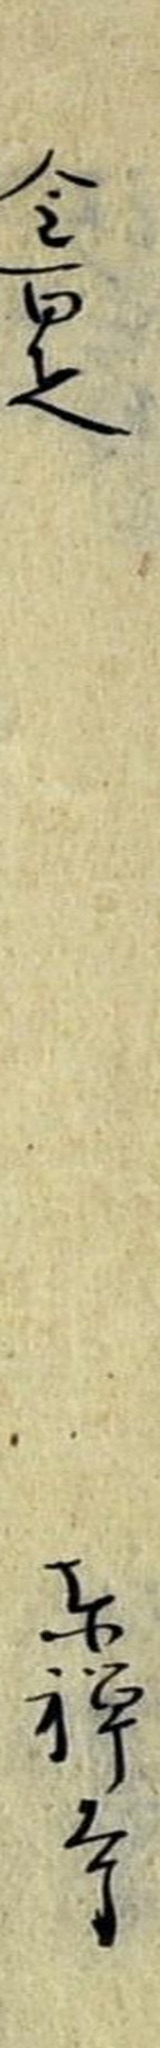金百疋東禅寺
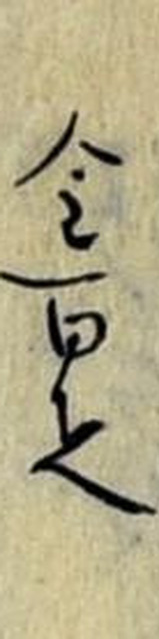金百疋
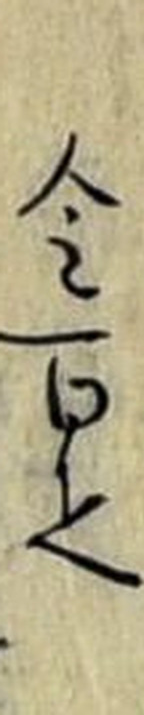金百疋
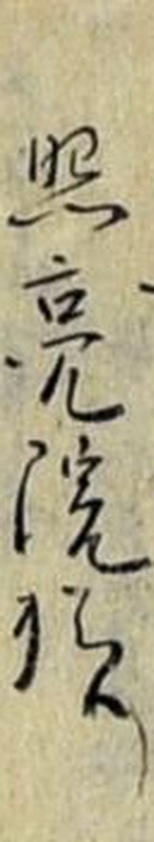照亮院様
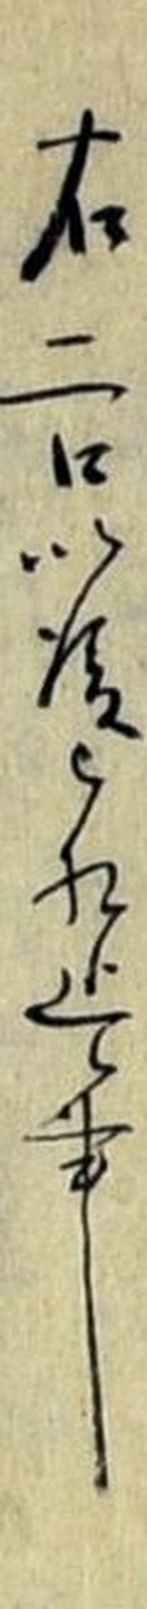右二口以後被相止候事
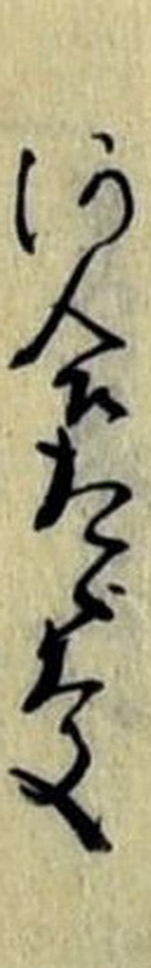河合太郎太夫
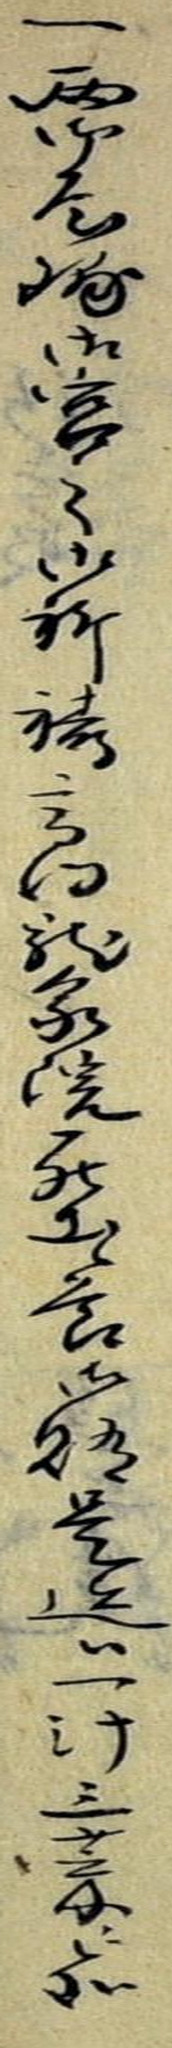一両御屋鋪御宮之御祈祷髙田龍泉院罷出候節御賄是迄は一汁三菜に候処
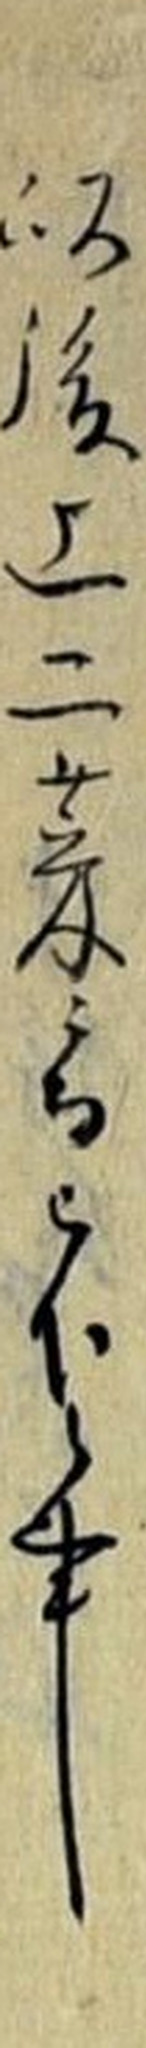以後上二菜に而被下候事
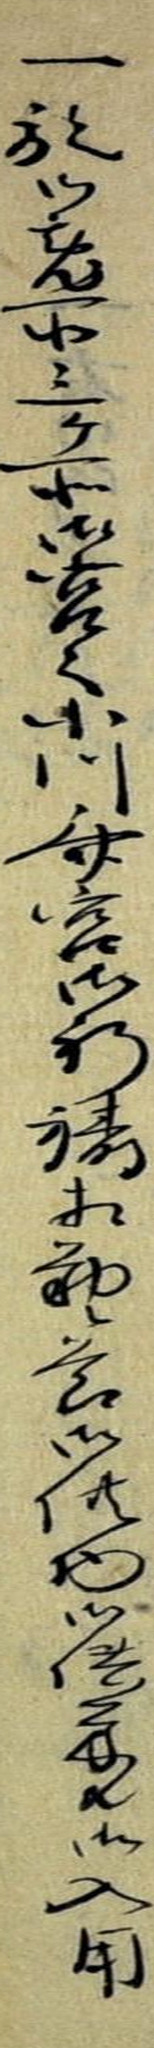一於御台所三ヶ所御宮へ小川斎宮御祈祷相勤候節御供物御供米共御入用
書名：命令之部 四
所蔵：福井県文書館 Fukui Prefectural Archives
